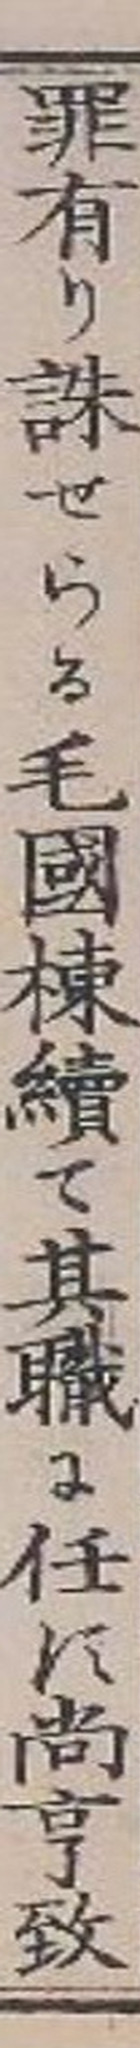罪有り謀せらる毛国棟続て其職に任す尚亨致
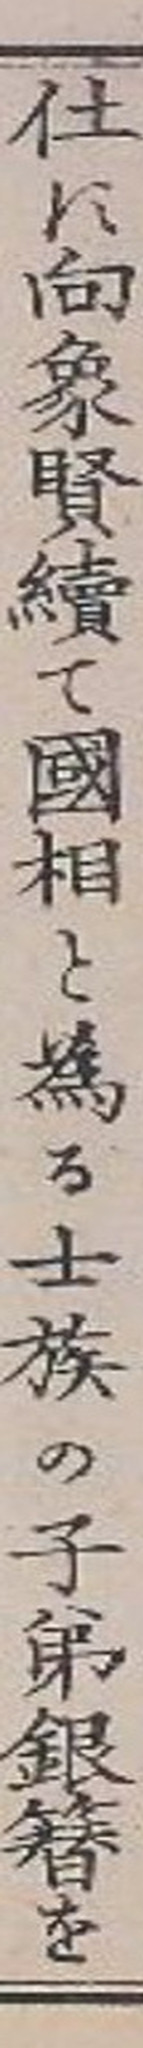仕す向象賢続て国相と為る士族の子弟銀簪を
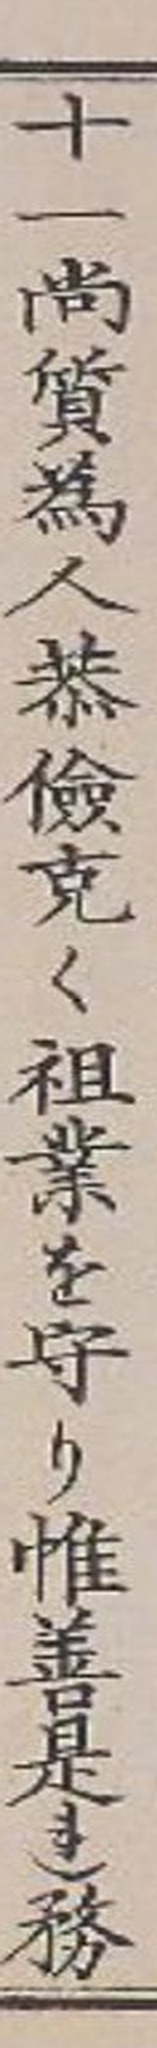十一尚質為人恭倹克く祖業を守り唯善是れ務
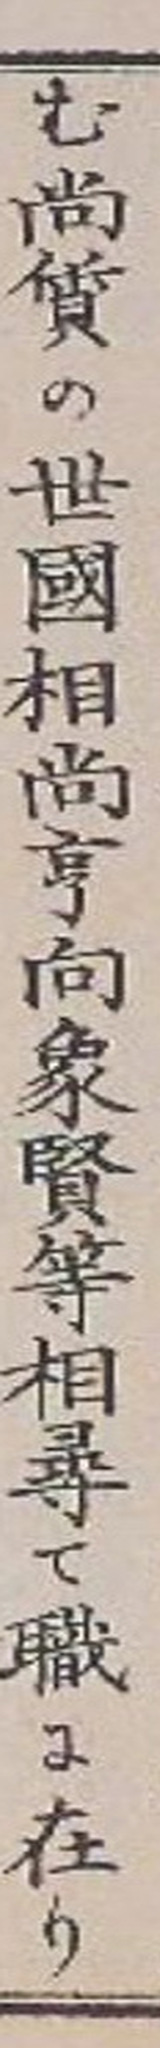む尚質の世国相尚亨向象賢等相尋て職に在り
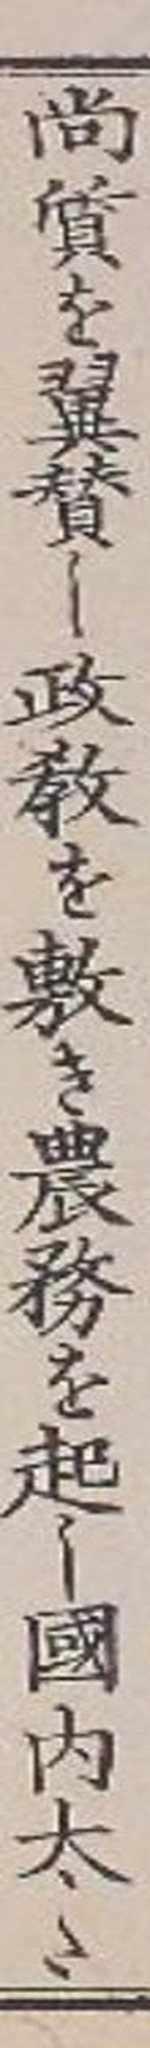尚質を翼賛し政教を敷き農務を起し国内太た
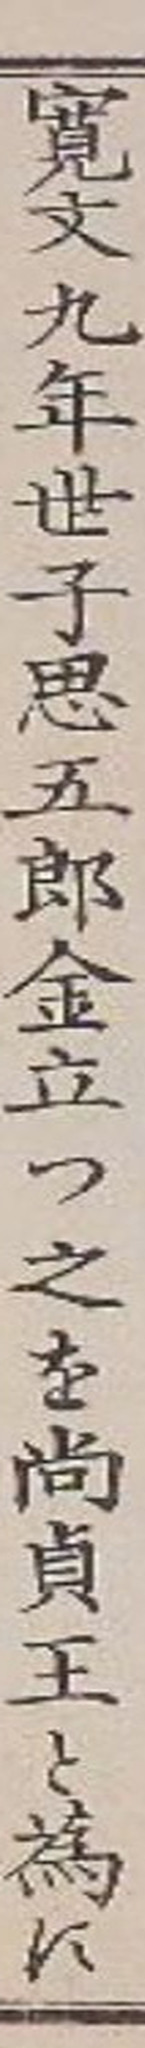寛文九年世子思五郎金立つ之を尚貞王と為す
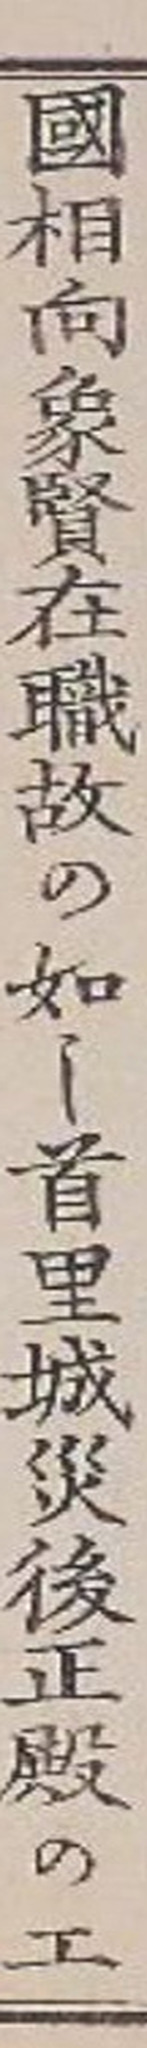国相向象賢在職故の如し首里城災後正殿の工
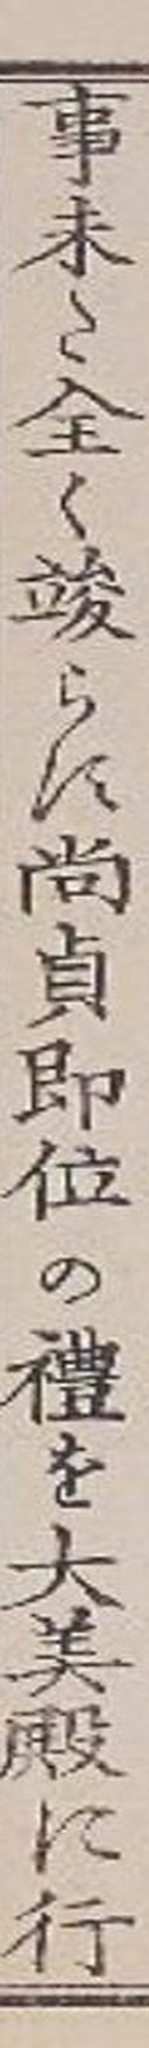事未た全く竣らす尚貞即位の礼を大美殿に行
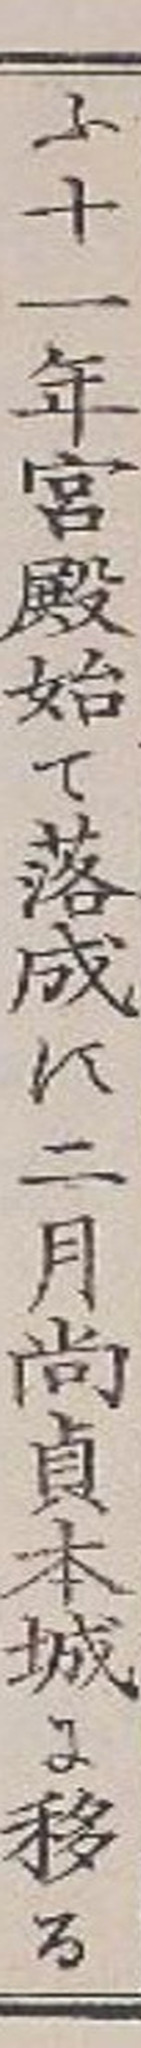ふ十一年宮殿始て落成す二月尚貞本城に移る
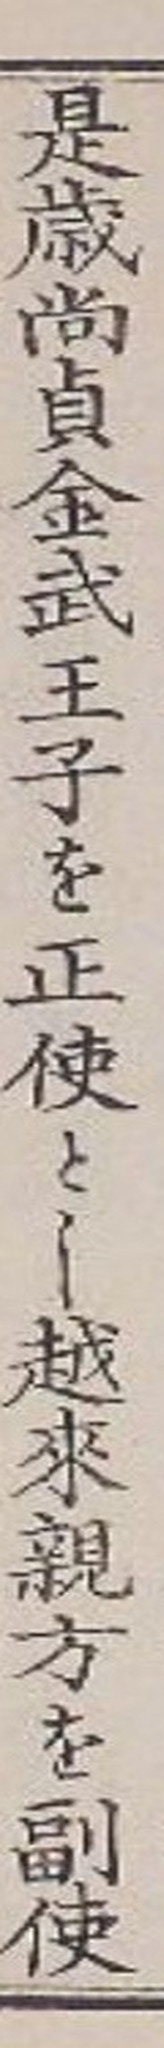是歳尚貞金武王子を正使とし越来親方を副使
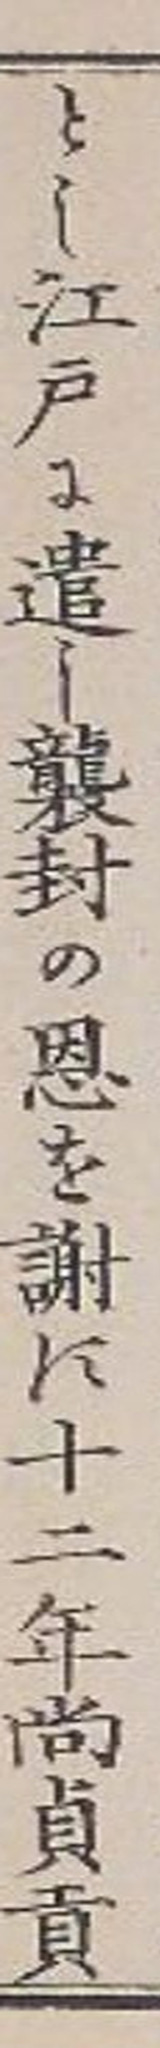とし江戸に遣し襲封の恩を謝す十二年尚貞貢
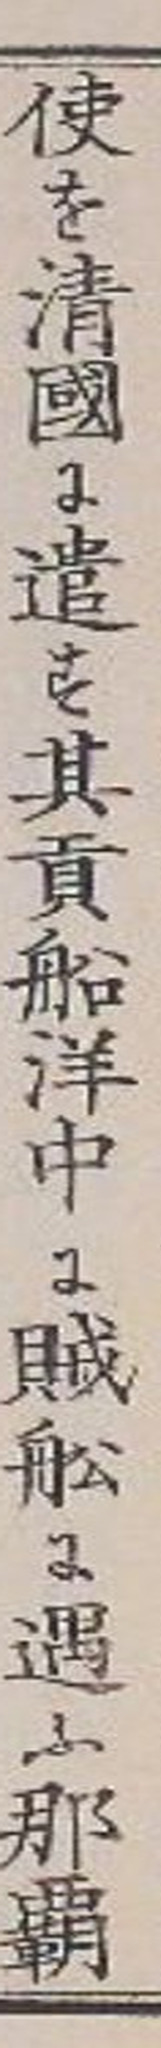使を清国に遣す其貢船洋中に賊船に遇ふ那覇
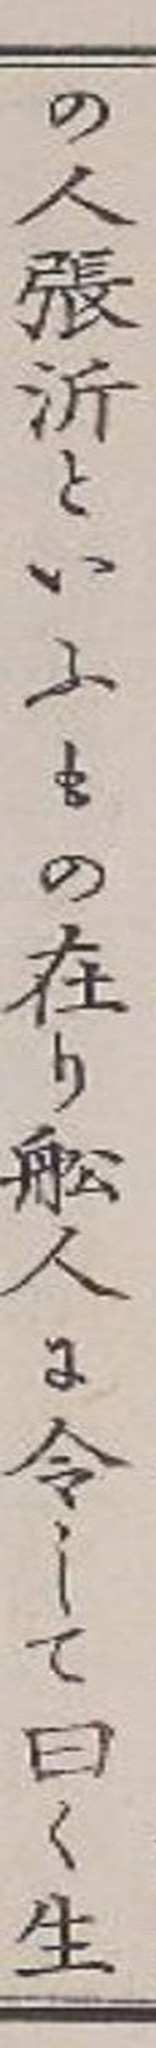の人張沂といふもの在り船人に令して曰く生
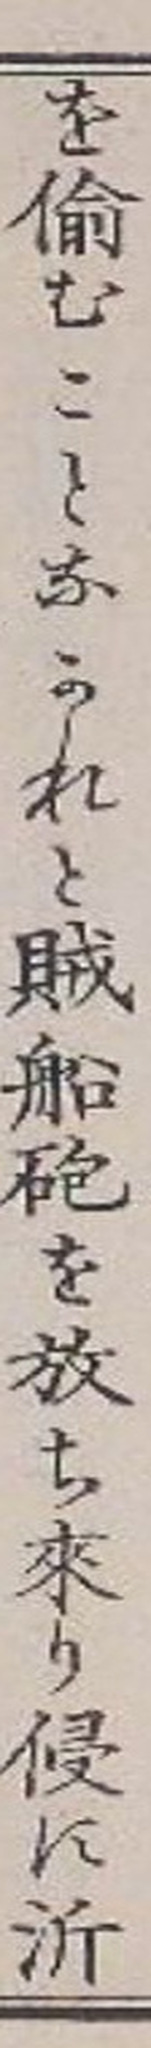を愉むことなかれと賊船砲を放ち来り侵す沂
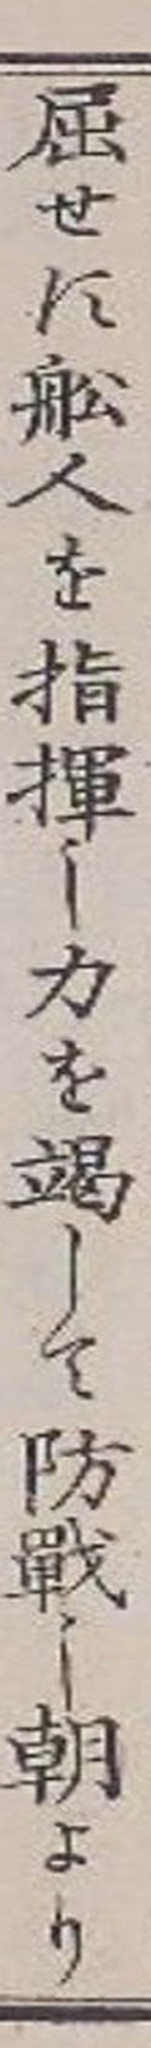屈せす船人を指揮し力を竭して防戦し朝より
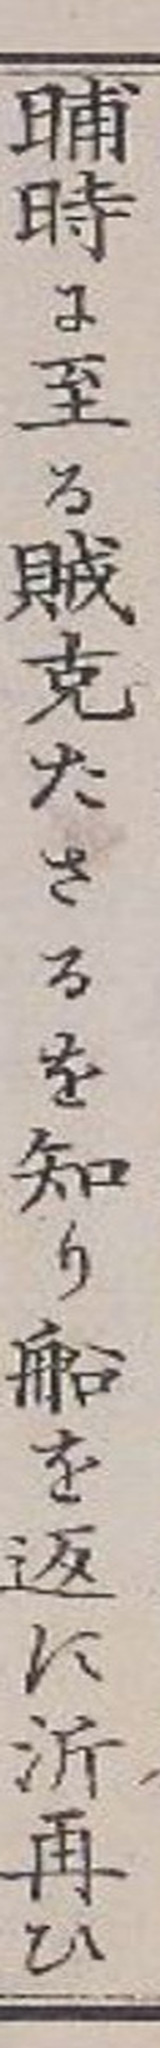晡時に至る賊克たさるを知り船を返す沂再ひ
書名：南島紀事 下
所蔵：University of the Ryukyus Library
